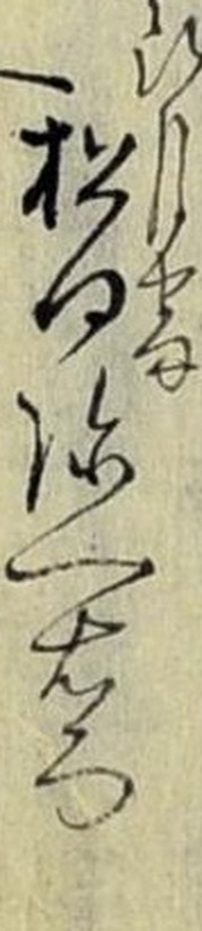松田弥一右衛門
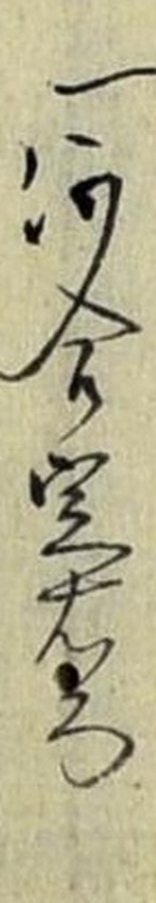河合定右衛門
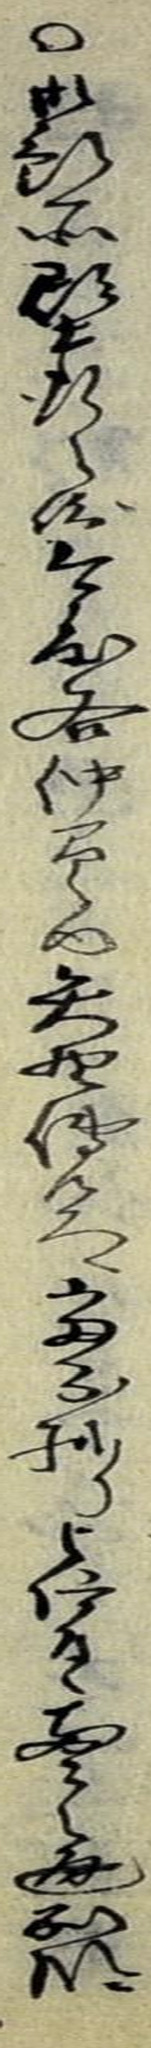〇御預所郡奉行之儀今度各仲間之内矢野伝左衛門へ当分掛り被仰付候前々之通別段に
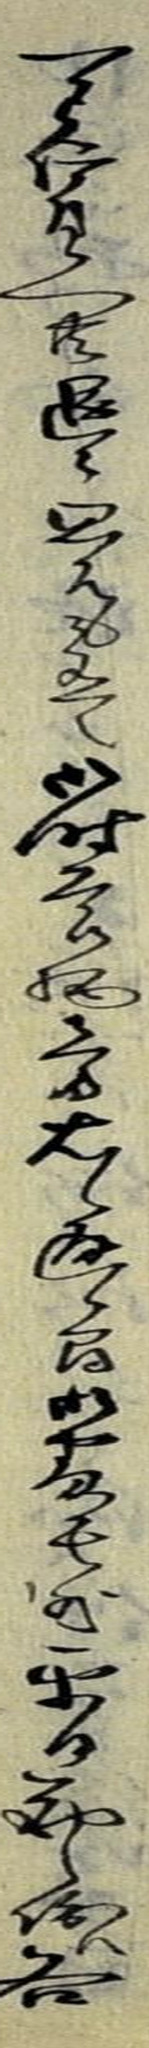可被仰付候へ共追々思召も有之御時節柄旁右之通候間御番其外平日勤之儀は各
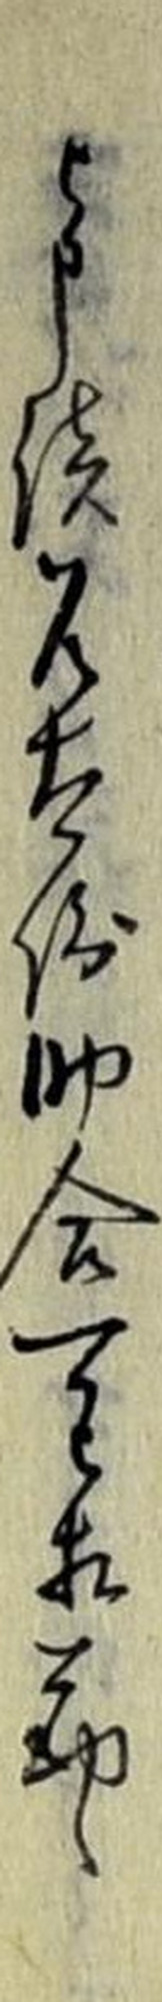被申談乍太儀助合可被相勤候
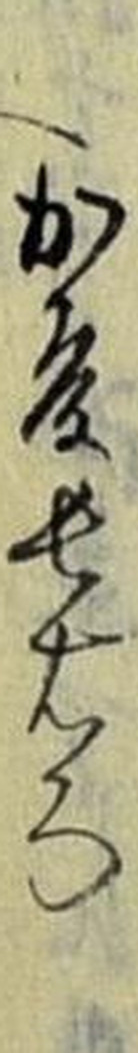加藤長右衛門
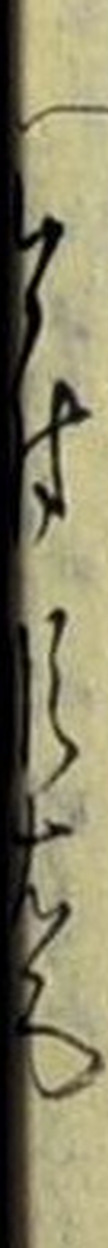今村段右衛門
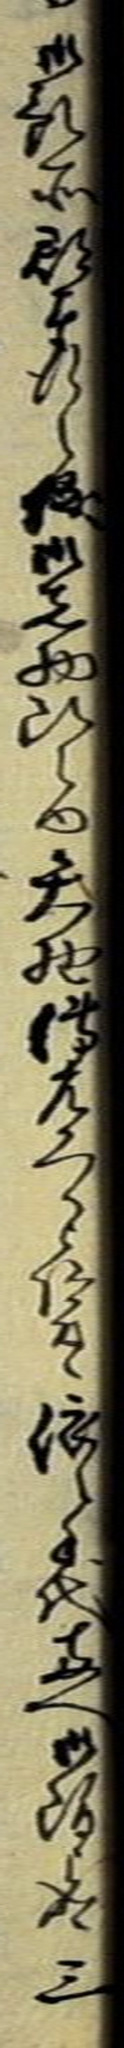〇御預所郡奉行之儀御先物頭之内矢野伝左衛門へ被仰付候依之手代両人へ御附被成候三
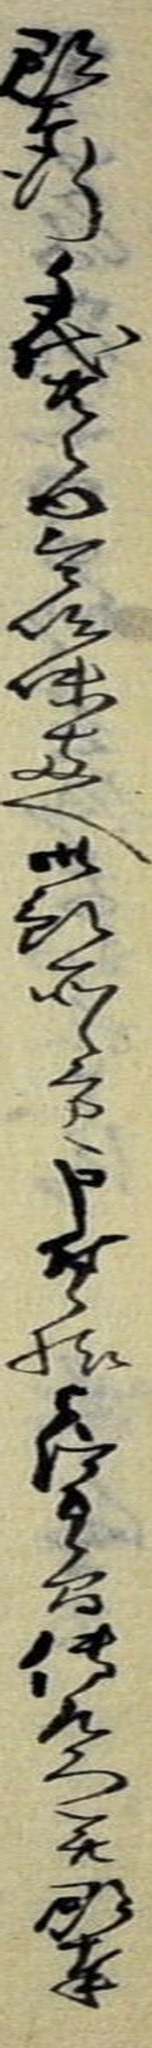郡奉行手代共之内令吟味両人御預所方へ申付候様被仰付候間伝左衛門并郡奉
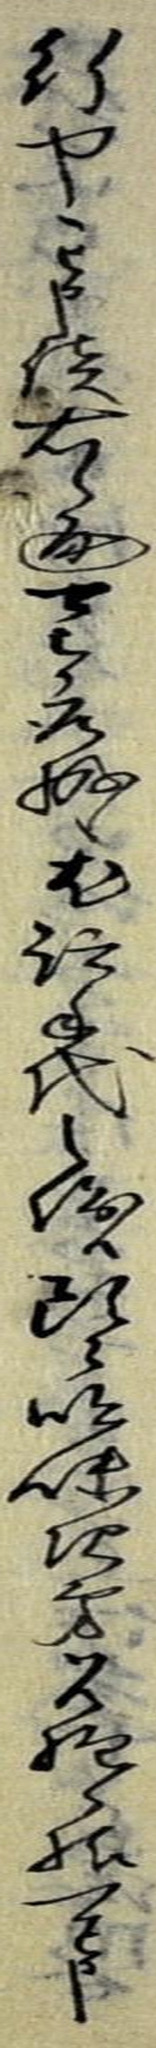行中へ被申談右之通可被取扱候尤跡手代之儀は頭々吟味次第召抱候様可被申
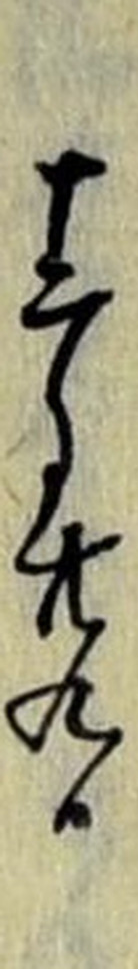十二月廿九日
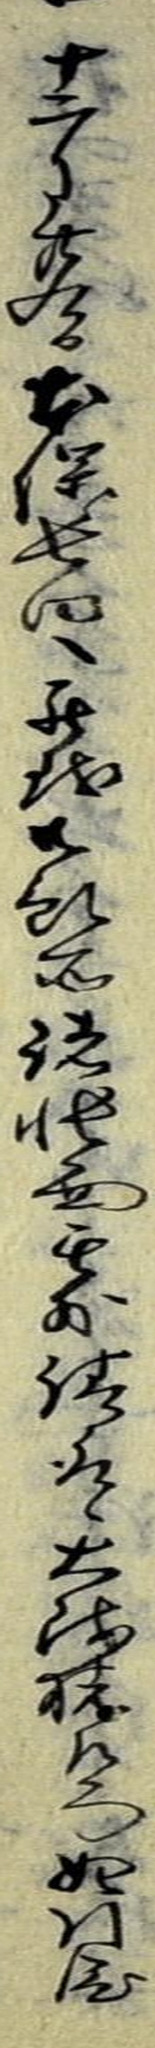〇十二月廿九日本保長田へ罷越御預所諸帳面其外請取候大越猪左衛門始引渡
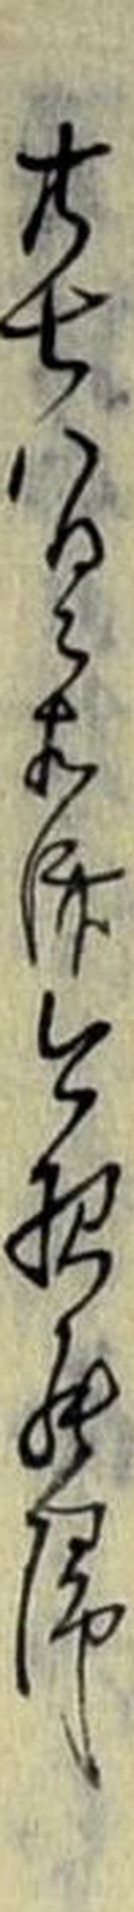廿七八日に相済今夜罷帰候
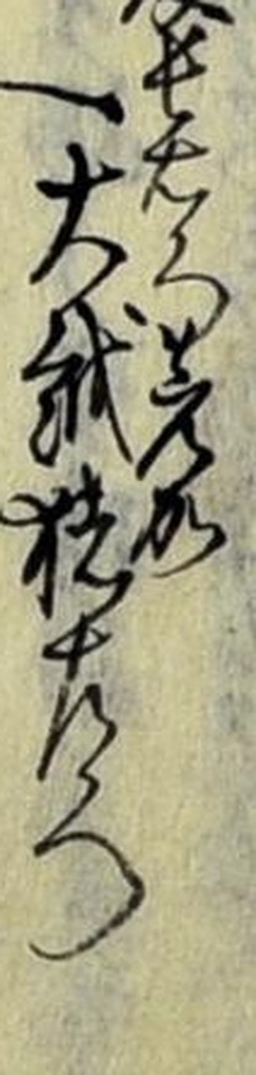大越猪左衛門
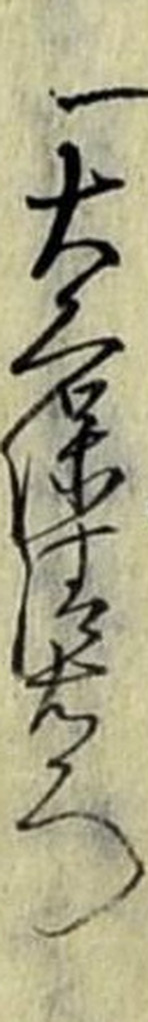大久保清右衛門
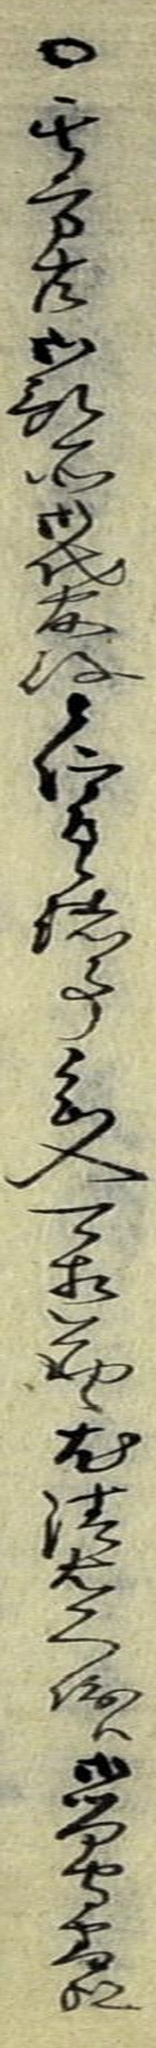〇其方共御預所御代官役被仰付候諸事念入可相勤候尤清右衛門儀は御留守番組
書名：命令之部 二
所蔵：福井県文書館 Fukui Prefectural Archives
